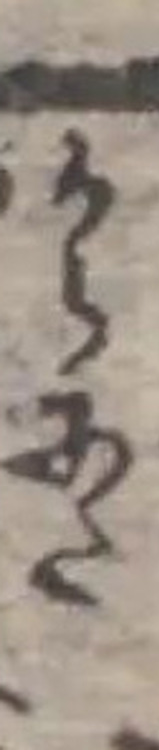からにた
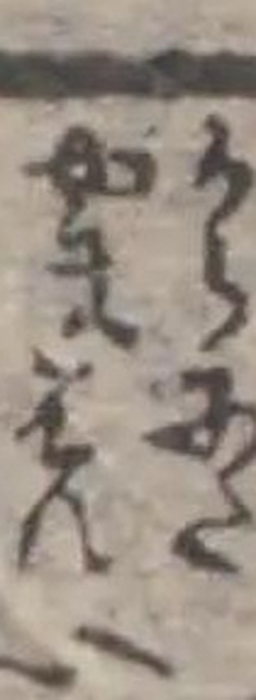やまはん
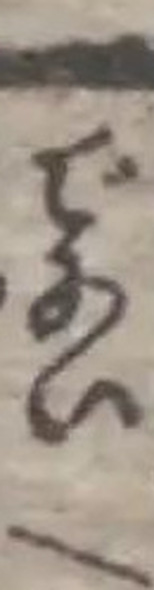であい
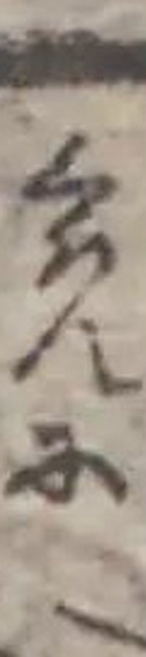くはんに
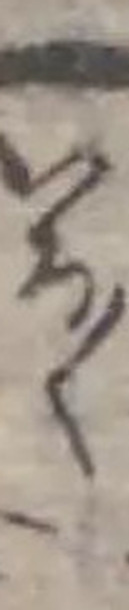いろ〳〵
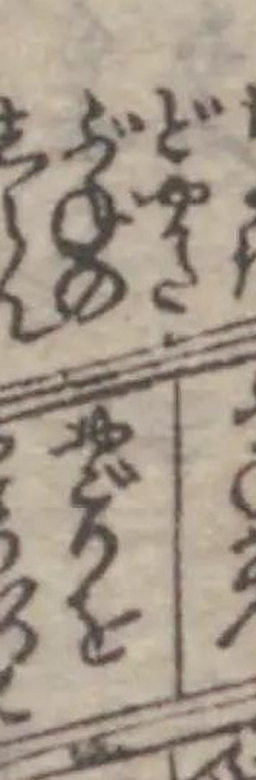ぶねのおごりを
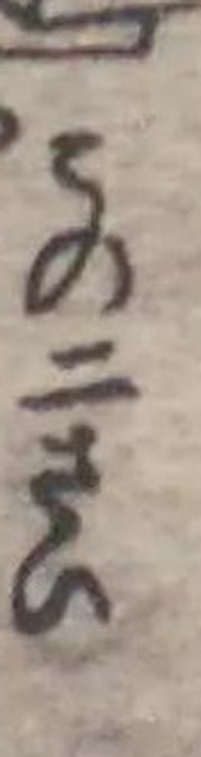この二さい
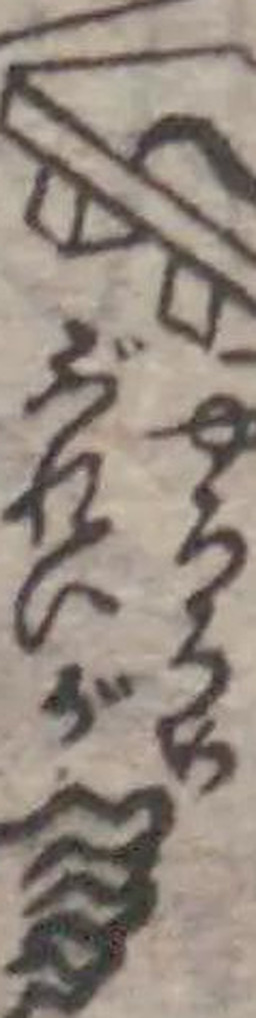ぶれいが
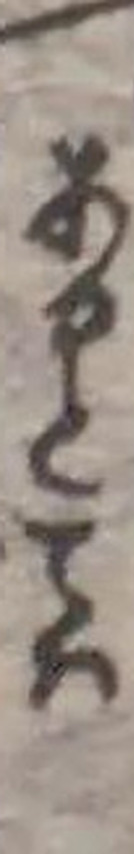あるとては
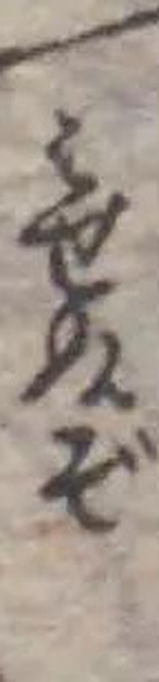みせぬぞ
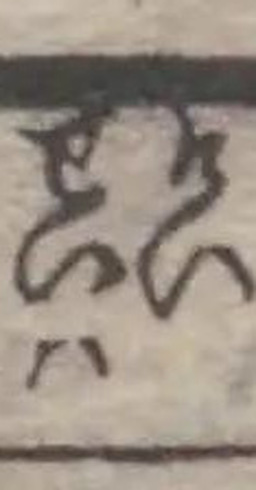せいは
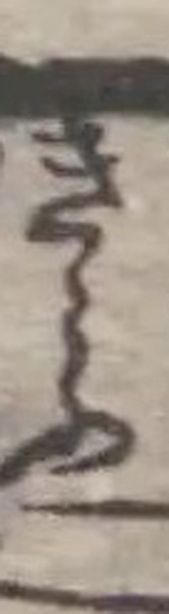きゝふ
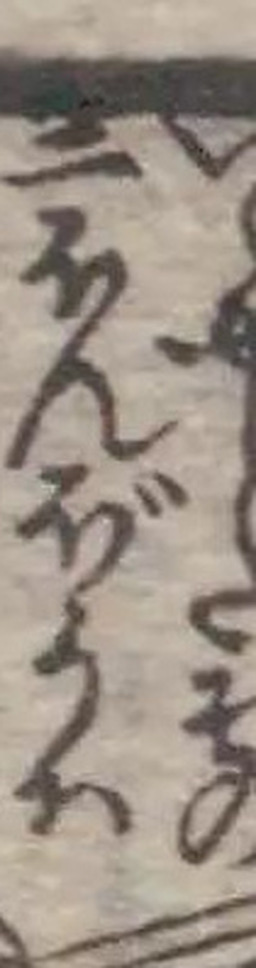二ほんぼうは
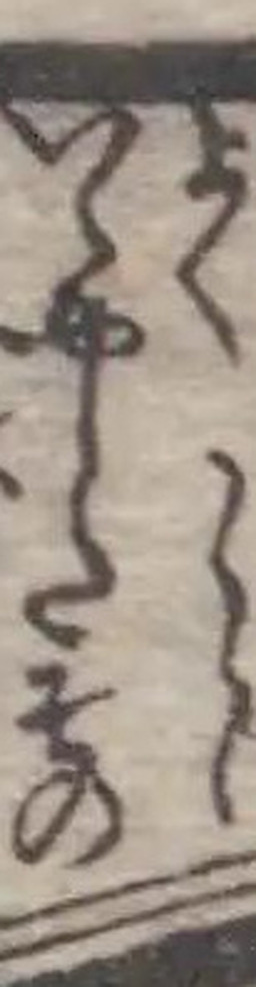いゝやしたその
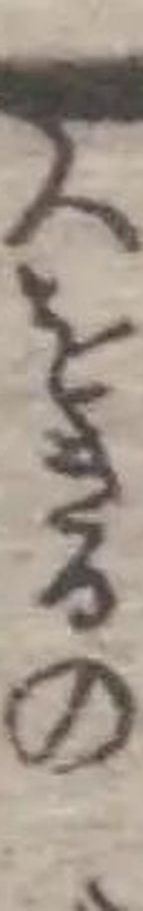人をきるの
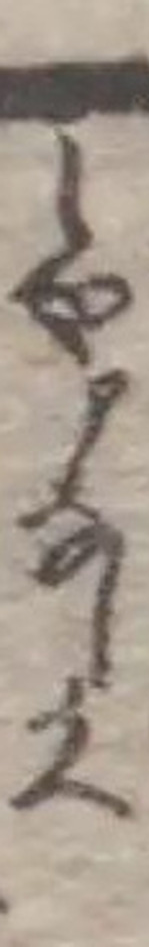しやアなしかへ
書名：富多高慢噺 3巻
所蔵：国立国会図書館 National Diet Library, JAPAN
